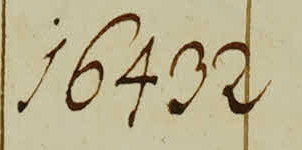16432
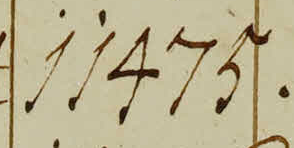11475
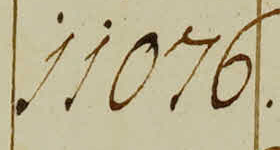11076
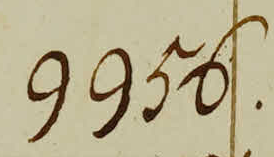9956
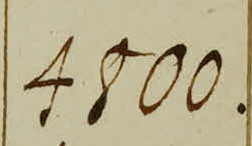4800
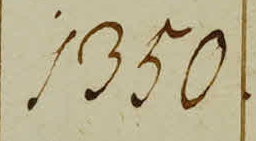1350
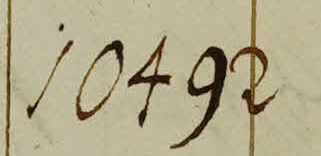10492
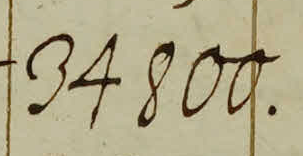34800.
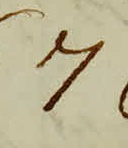7
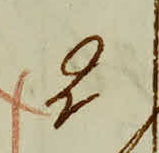2
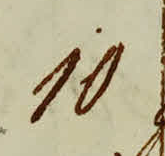10
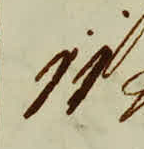11
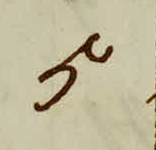5
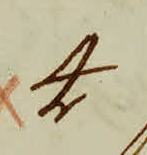4
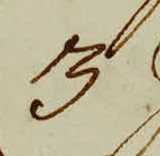3
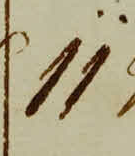11
